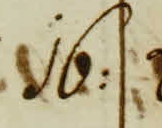16:
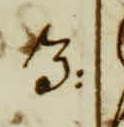3:
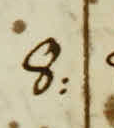8:
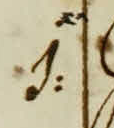1:
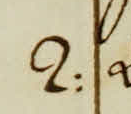2:
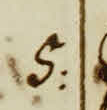5:
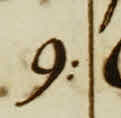9:
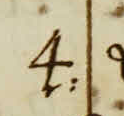4:
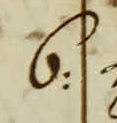6:
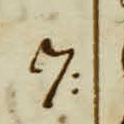7:
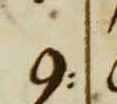9:
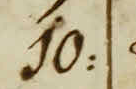10:
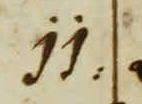11:
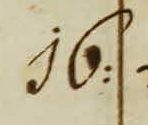16:
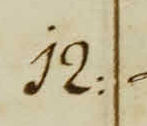12:
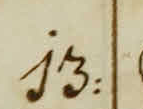13:
